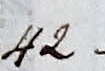42
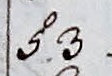53
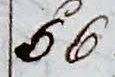56
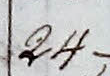24
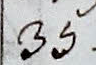35
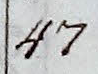47
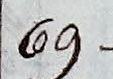69
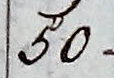36
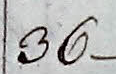36
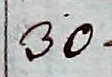30
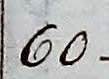60
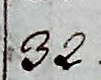32
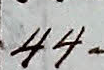44
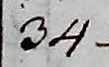34
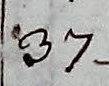37
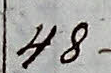48
